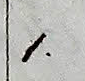1.
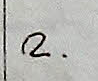2.
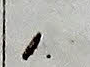1.
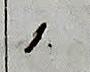1.
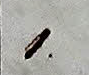1.
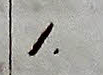1.
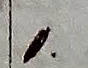1.
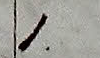1.
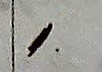1.
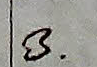3.
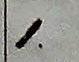1
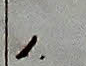1.
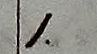1.
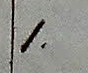1.
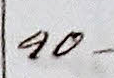40
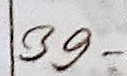39
